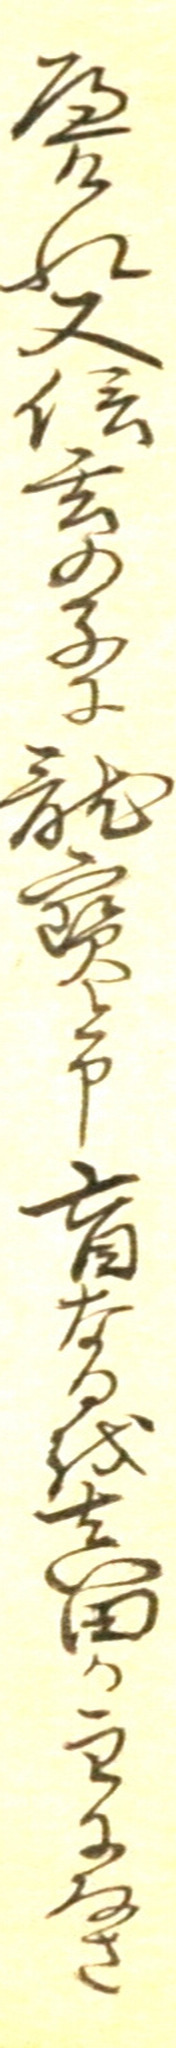へけれ又信玄の子に龍寶と申盲なるを真田か主になさ
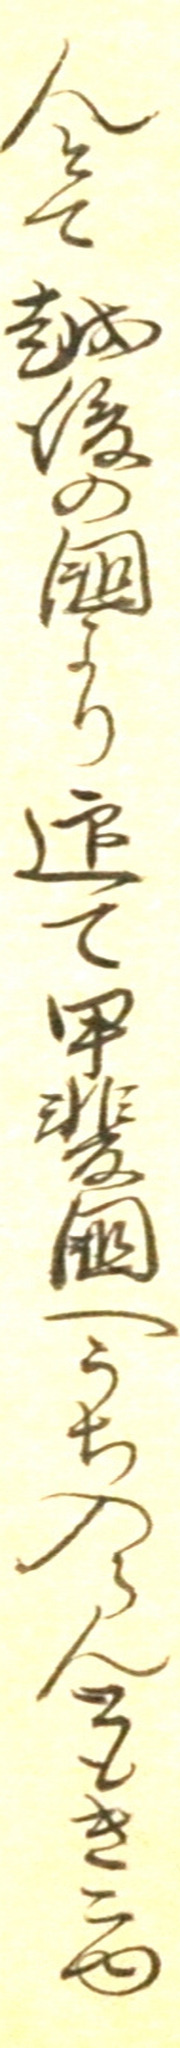んとて越後の国より迎て甲斐国へうち入らんともきこゆ
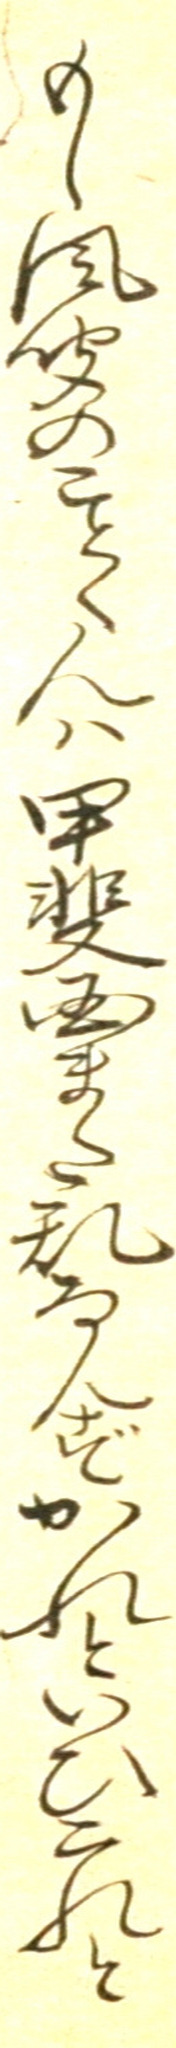もし風聞のことくんは甲斐国また乱なんずかれといひこれと
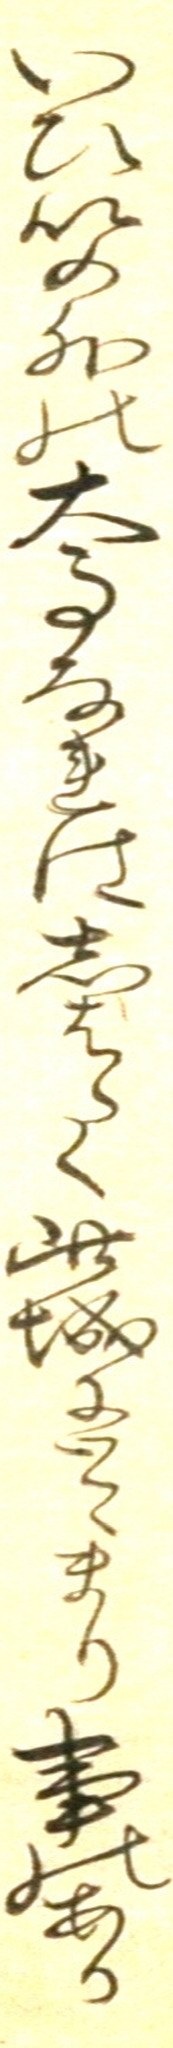いひ以の外の大事なれはしはらく此城にとゝまり事のあり
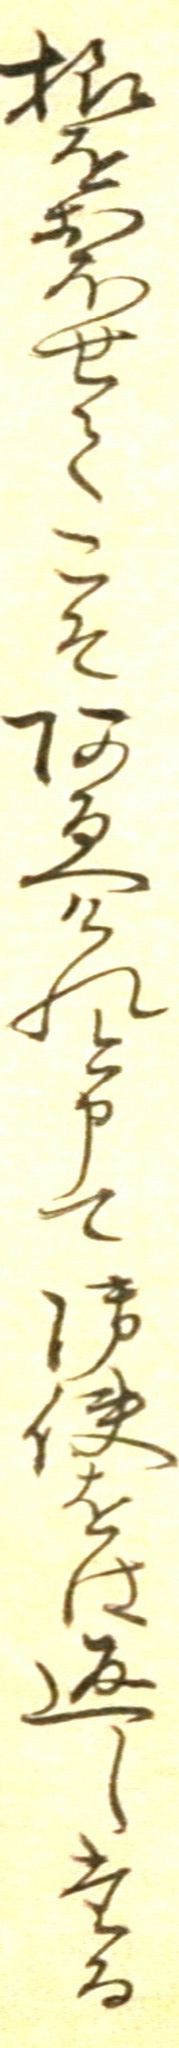様をおほせてこそあるへけれと申て御使をは返したる
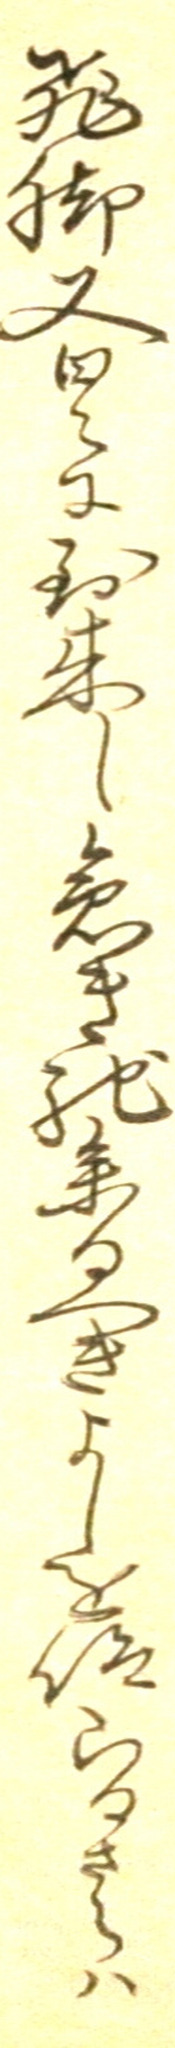飛脚又日々に到来し急き馳参るへきよしを仰らるさらは
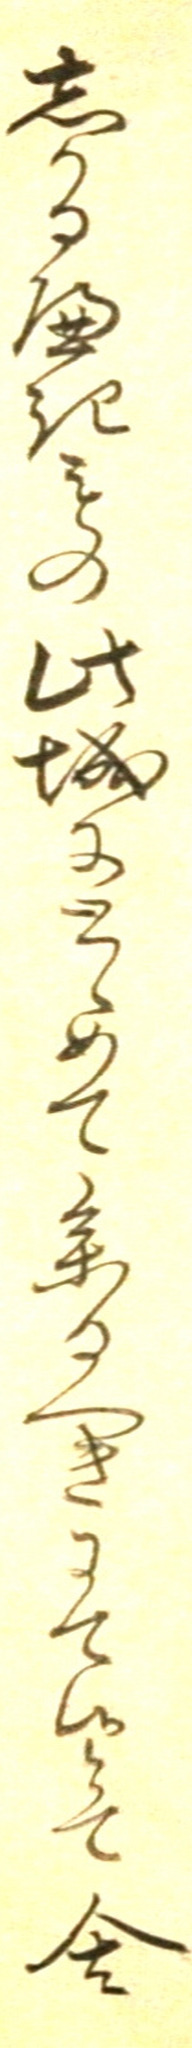しかるへきもの此城にとゝめて参るへきにて候とて舎
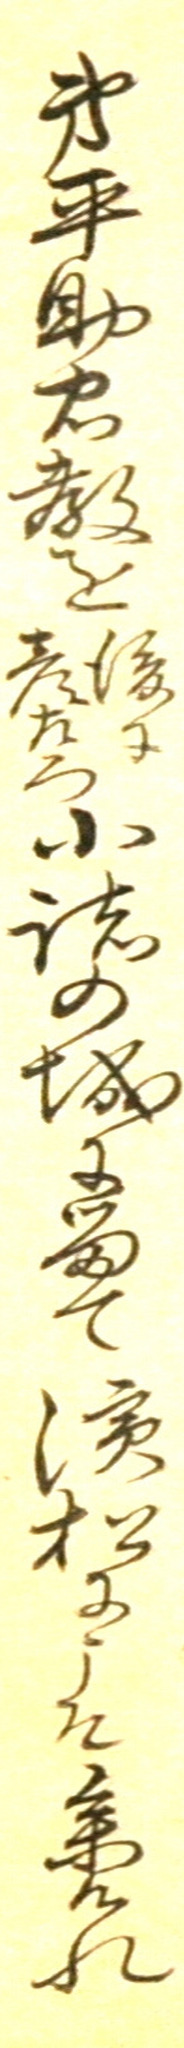弟平助忠教を後に彦左衛門小諸の城に留て浜松にこそ参けれ

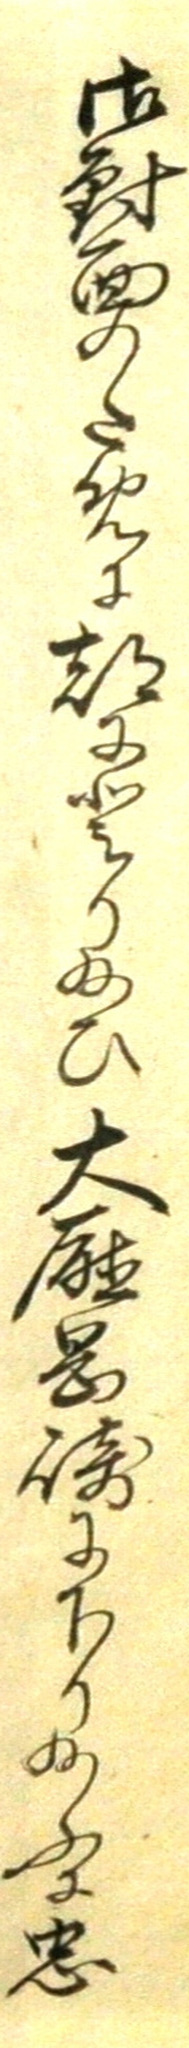御対面のために都に登り給ひ大廰岡崎に下り給ふに忠
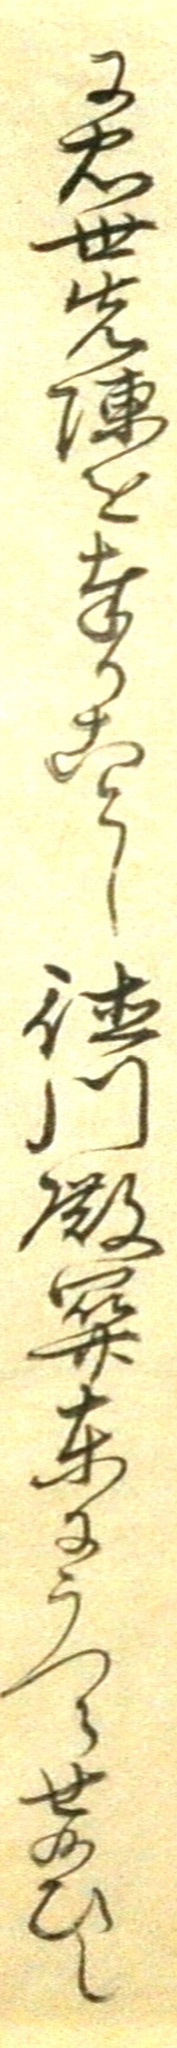に忠世先陣を奉りことし徳川殿関東にうつらせ給ひし
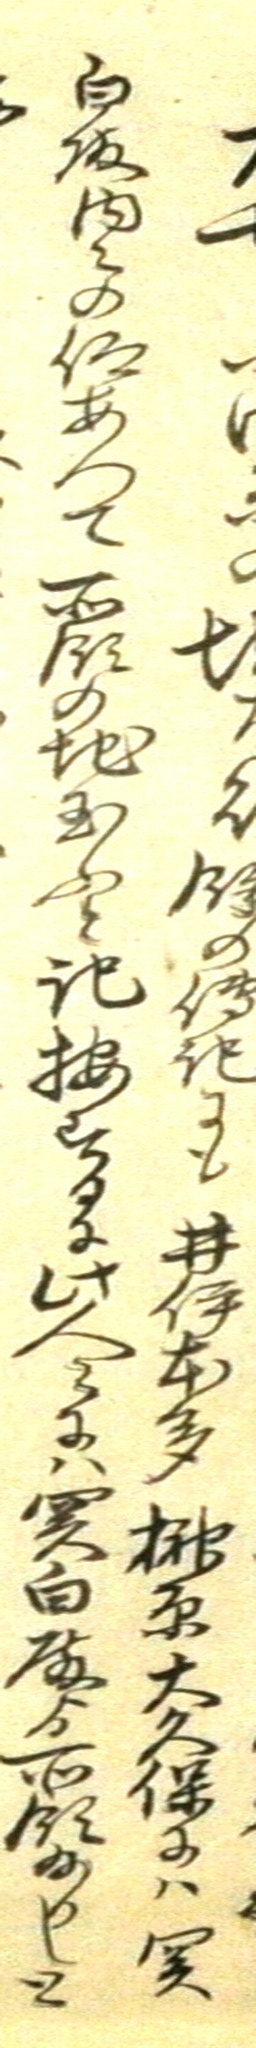白殿内々の仰あつて所領の地玉ふと記按するに此人々には関白殿ゟ所領給りしと
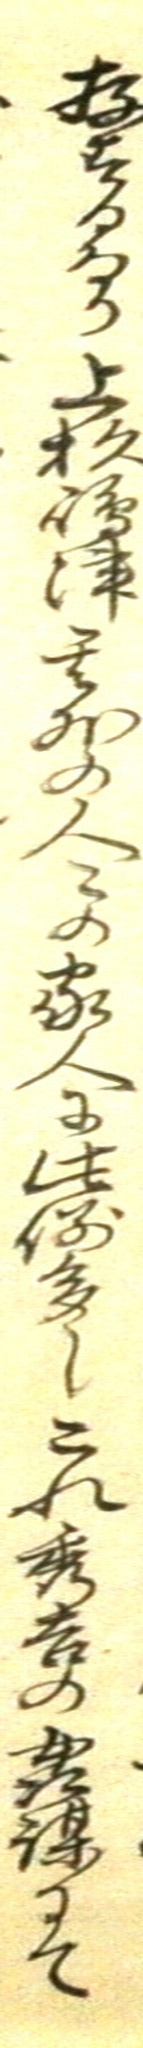存するなり上杉嶋津其他の人々の家人に此例多しこれ秀吉の姦謀にて
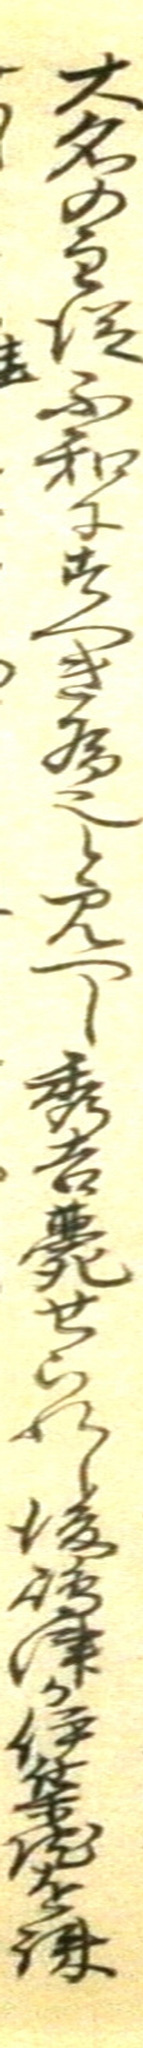大名の主従不和にすへき為也と見へし秀吉薨せられし後嶋津か伊集院を誅
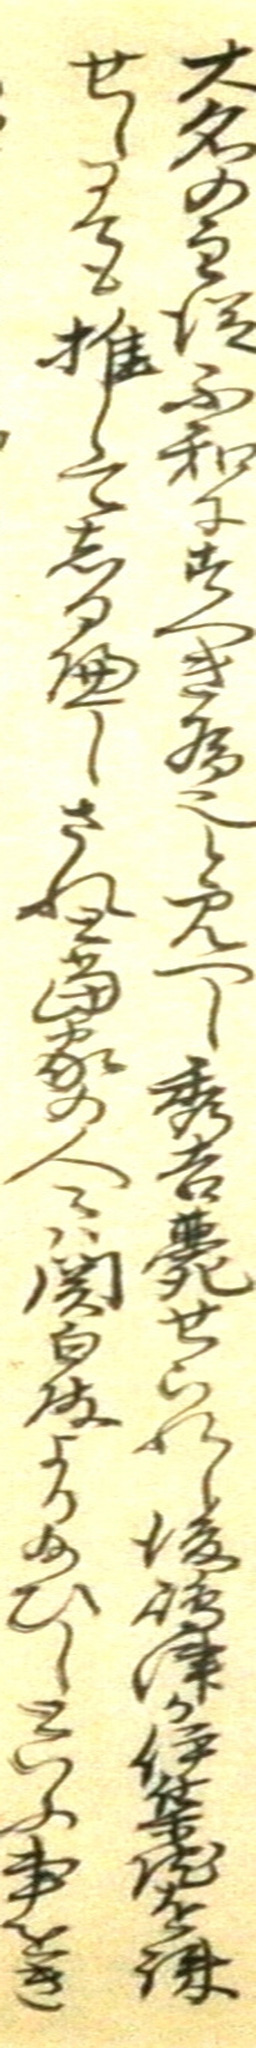せしにても推してしるへしされと当家の人々は関白殿より給ひしといふ事をき
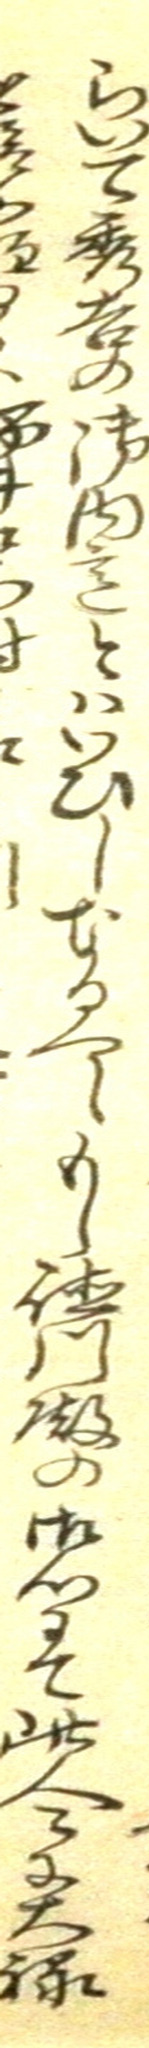らいて秀吉の御内意とはいひしなるへしもし徳川殿の御心にて此人々に大禄
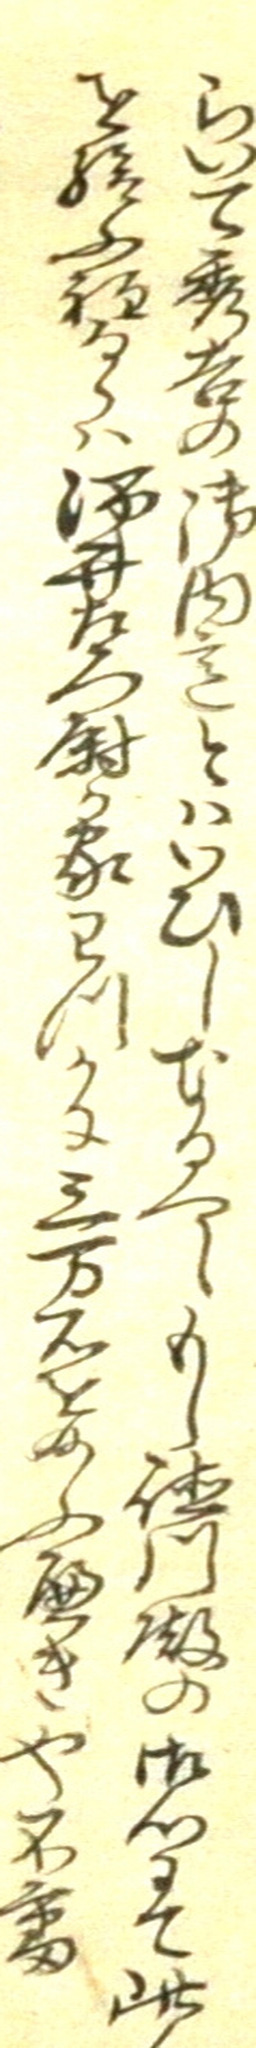を給ふ程ならは酒井左衛門尉か家わつかに三万石を給ふへきや不審
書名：藩翰譜（四・中）
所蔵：伊那市立高遠町図書館・合同会社AMANE
